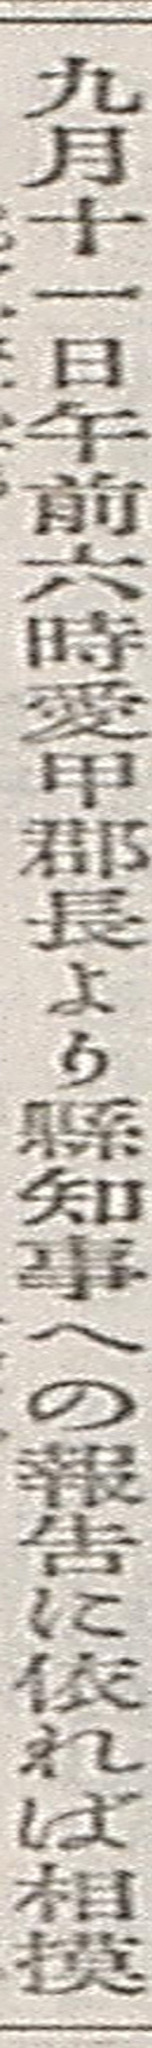九月十一日午前六時愛甲郡長より県知事への報告に依れば相模
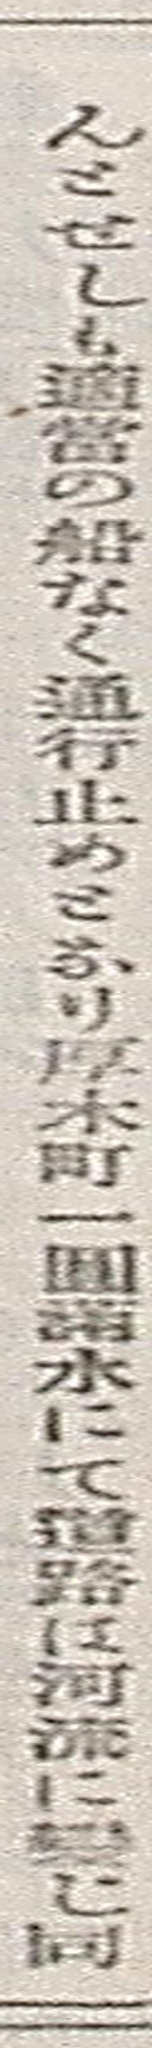んとせしも適当の船なく通行止めとなり厚木町一円満水にて道路は河流に変じ同
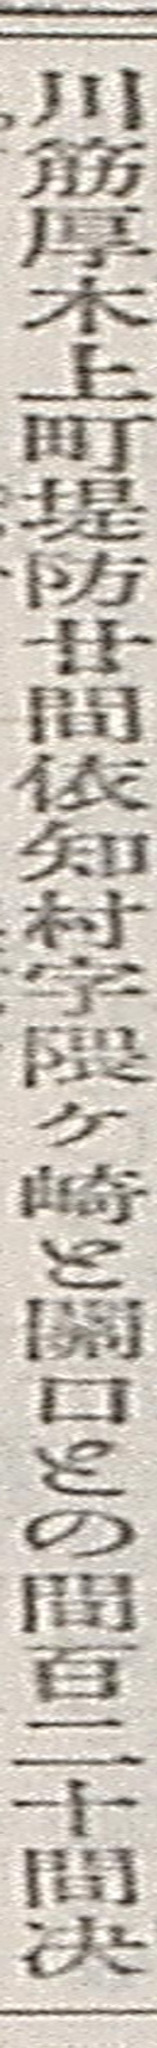川筋厚木上町堤防廿間依知村字隈ヶ崎と関口との間百二十間决
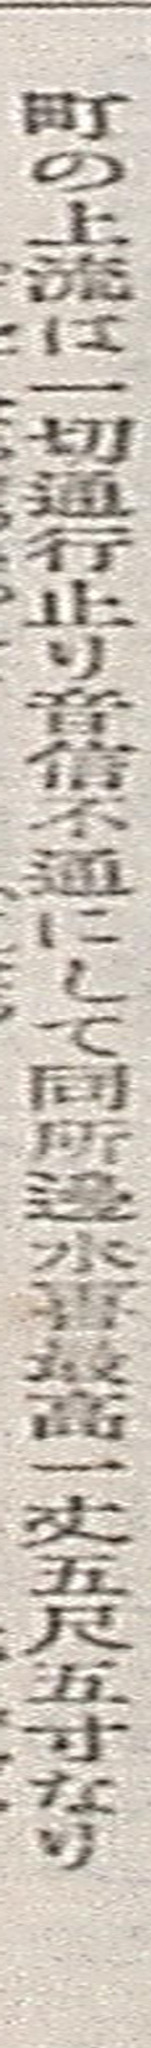町の上流は一切通行止り音信不通にして同所辺水量最高一丈五尺五寸なり
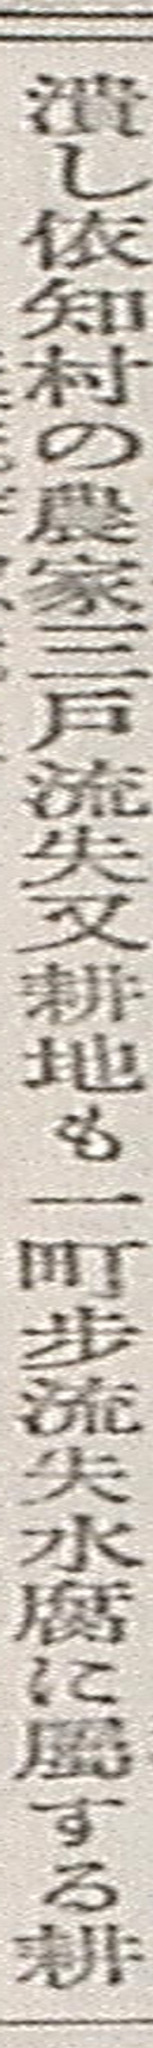潰し依知村の農家三戸流失又耕地も一町歩流失水腐に属する耕
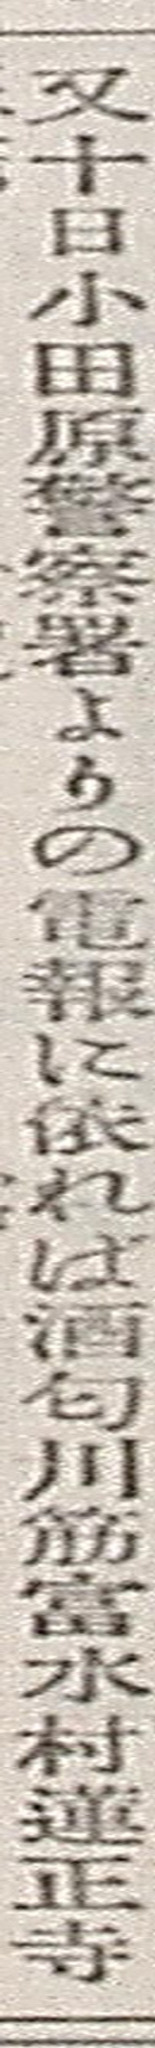又十日小田原警察署よりの電報に依れば酒匂川筋富水村蓮正寺
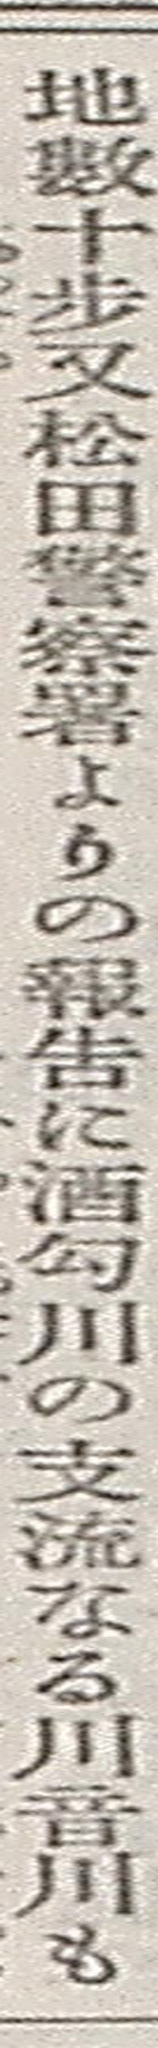地数十歩又松田警察署よりの報告に酒匂川に支流なる川音川も
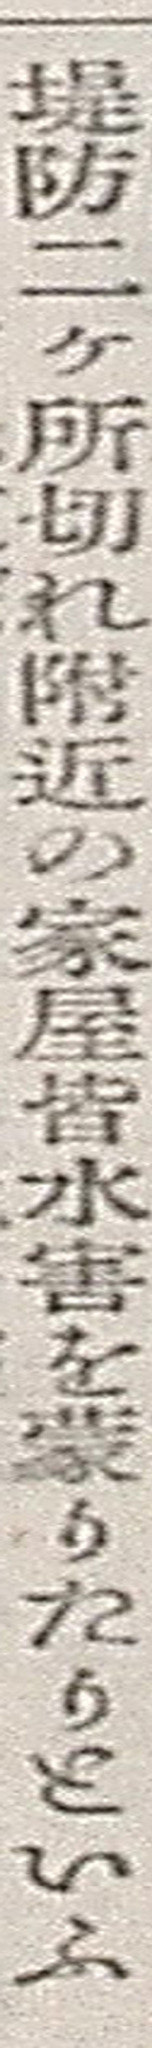堤防二ヶ所切れ附近の家屋皆水害を蒙りたりといふ
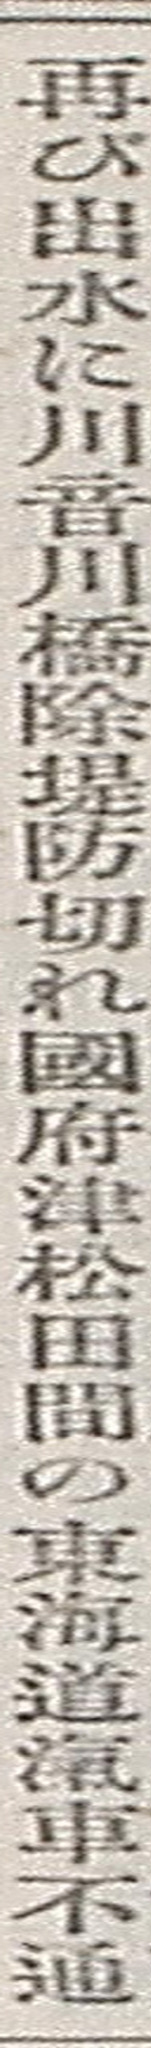再び出水に川音川橋除堤防切れ国府津松田間に東海道汽車不通
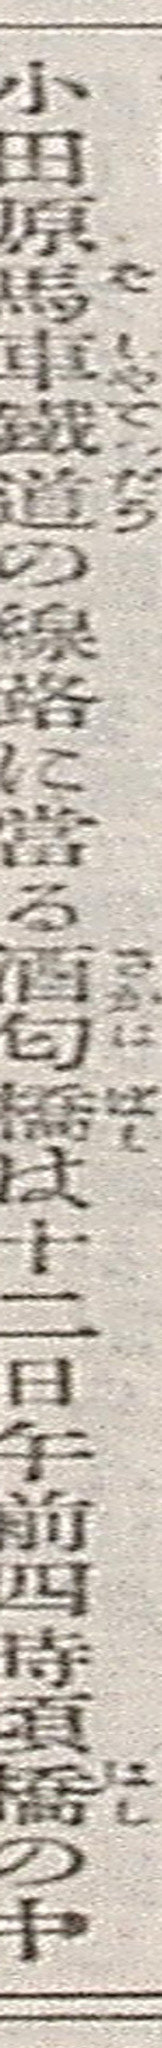小田原馬車鉄道の線路に当る酒匂橋は十二日午前四時頃橋の中
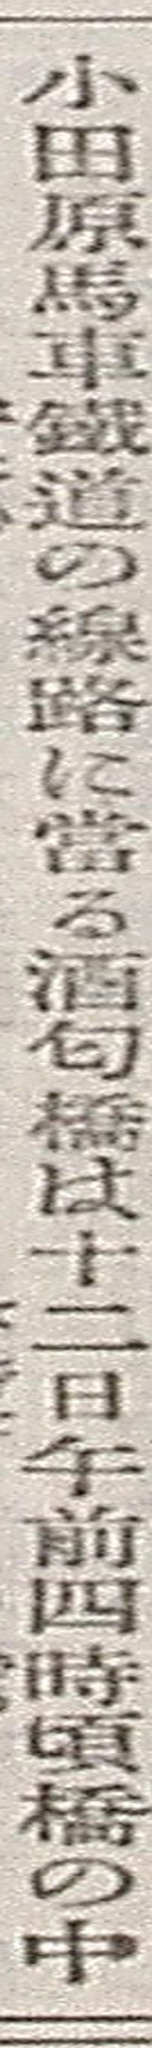小田原馬車鉄道の線路に当る酒匂橋は十二日午前四時頃橋の中
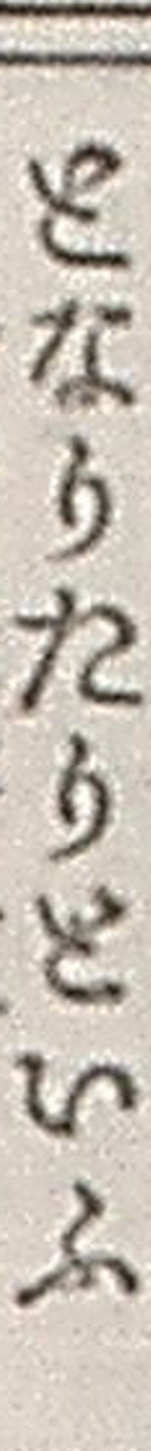となりたりといふ
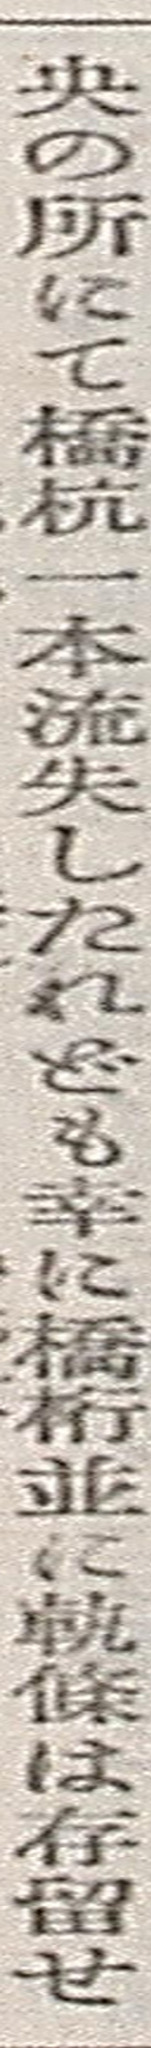央の所にて橋杭一本流失したれども幸に橋桁並に軌條は存留せ
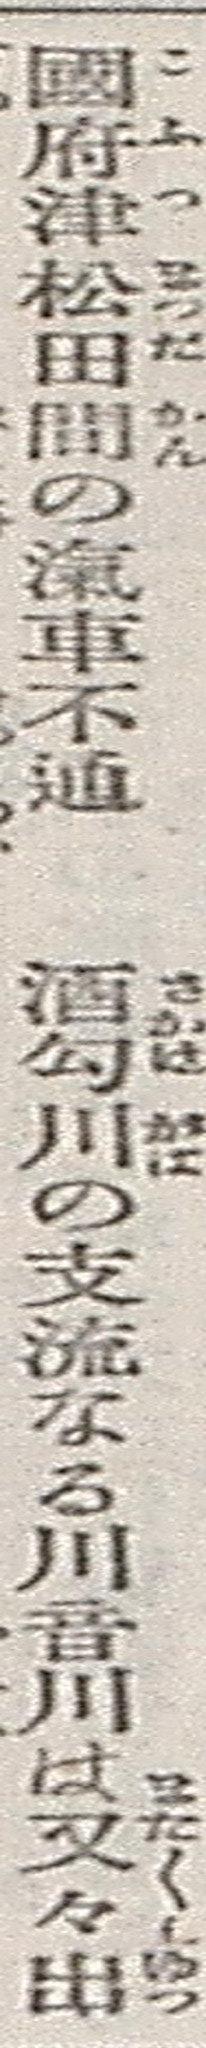国府津松田間の汽車不通酒匂川に支流なる川音川は又々出
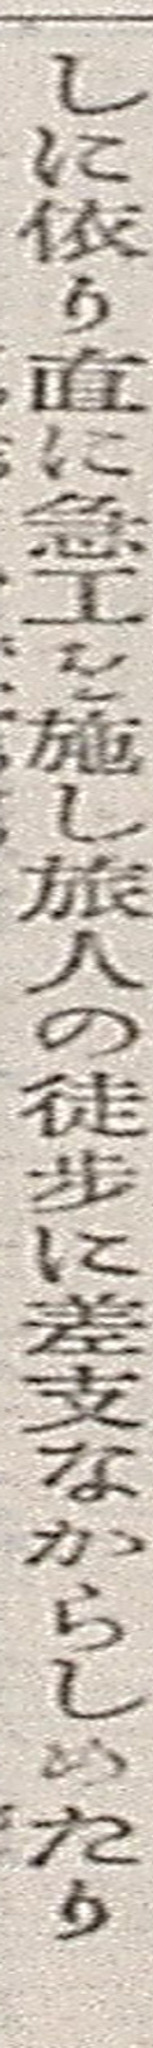しに依り直に急工を施し旅人の徒歩に差支なからしめたり
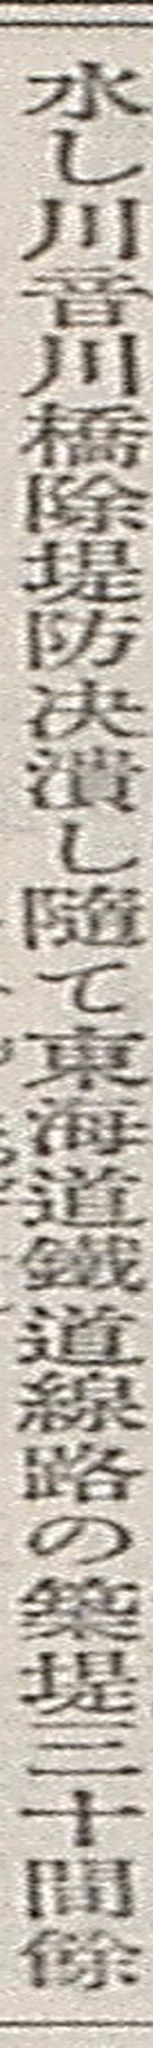水し川音川橋除堤防决潰し随て東海道鉄道線路の築提三十間餘
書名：風俗畫報臨時増刊第百二十八號　洪水被害録（下）
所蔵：東京大学地震研究所図書室 Earthquake Research Institute Library, The University of Tokyo, JAPAN
